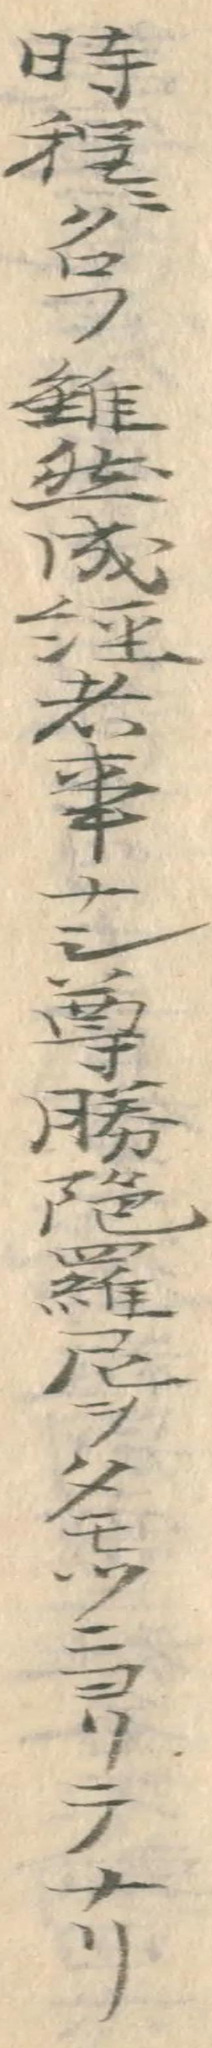時程ニクロフ雖然成経者事ナシ尊勝陀羅尼ヲタモツニヨリテナリ
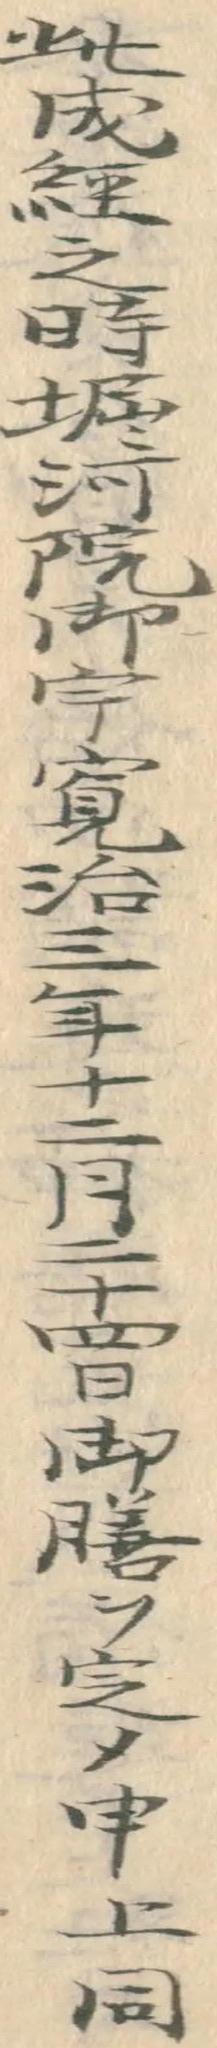此成経之時堀河院御宇寛治三年十二月二十四日御膳ヲ定メ申上同
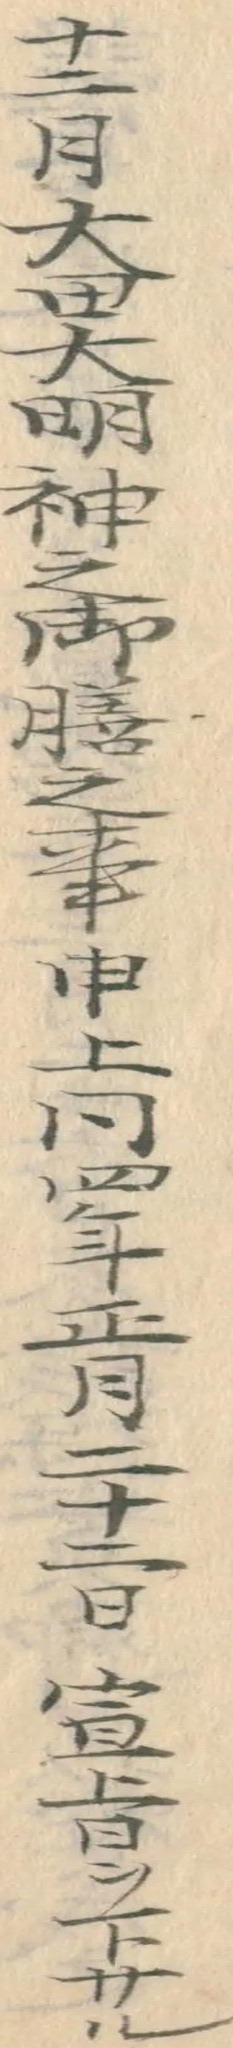十二月大田大明神之御膳之事申上同四年正月二十二日宣旨ヲ下サル
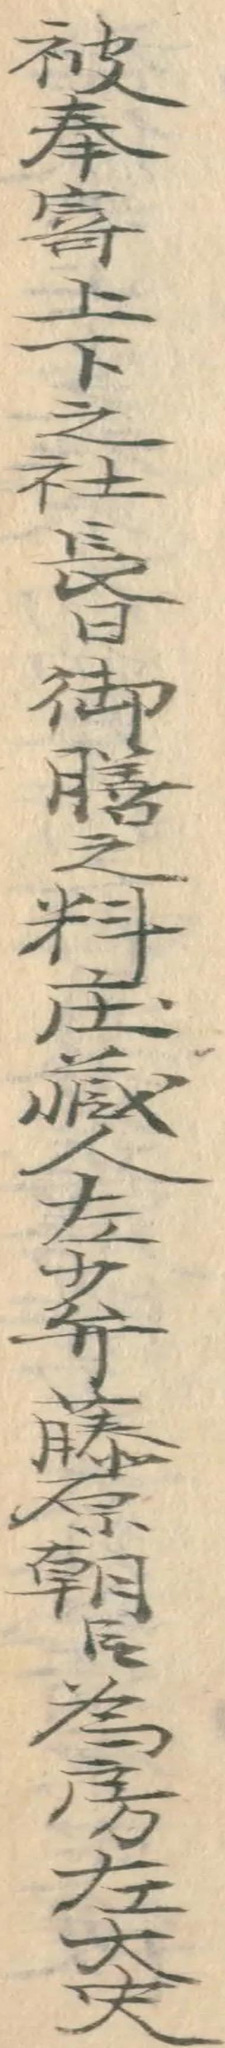被奉寄上下之社長日御膳之料庄蔵人左少弁藤原朝臣為房左大史

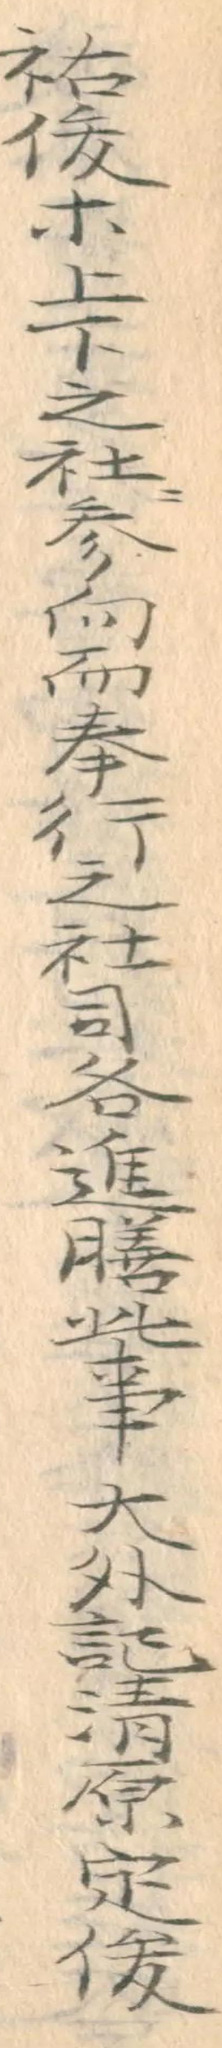祐俊等上下之社ニ参向而奉行之社司各進膳此事大外記清原定俊
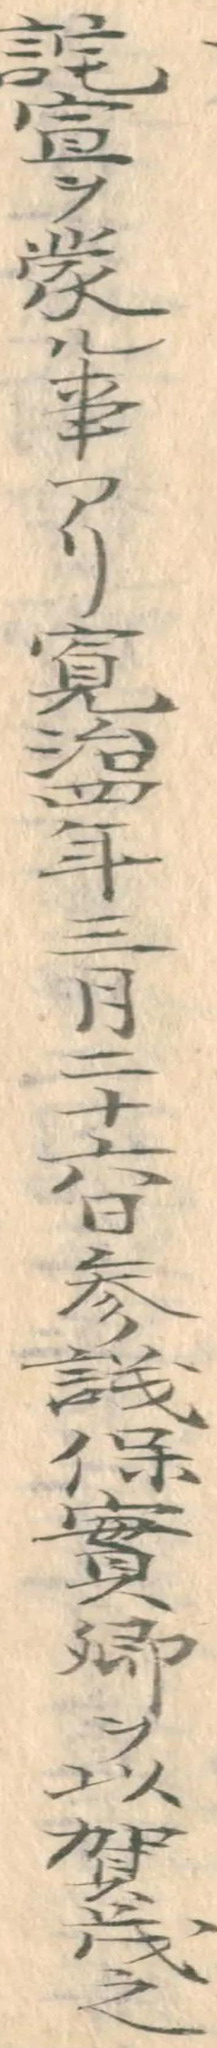詫宣ヲ蒙ル事アリ寛治四年三月二十六日参議保實卿ヲ以賀茂之
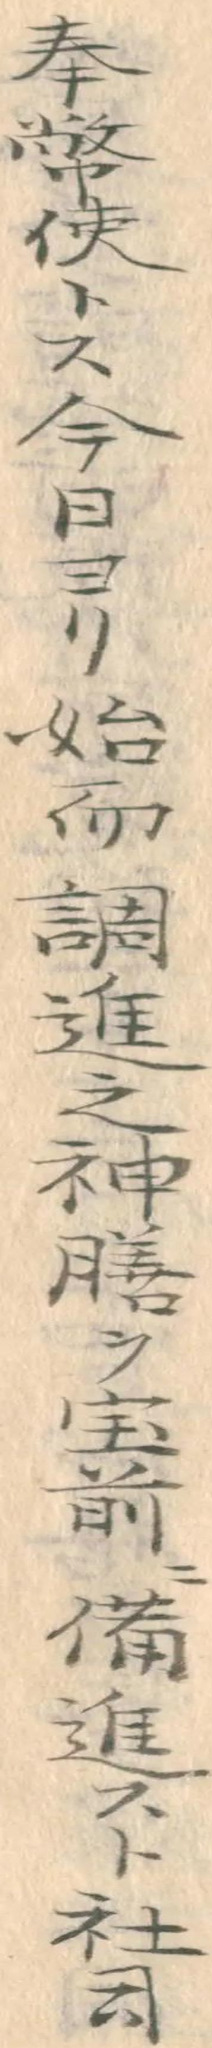奉幣使トス今日ヨリ始而調進之神膳ヲ宝前ニ備進スト社司
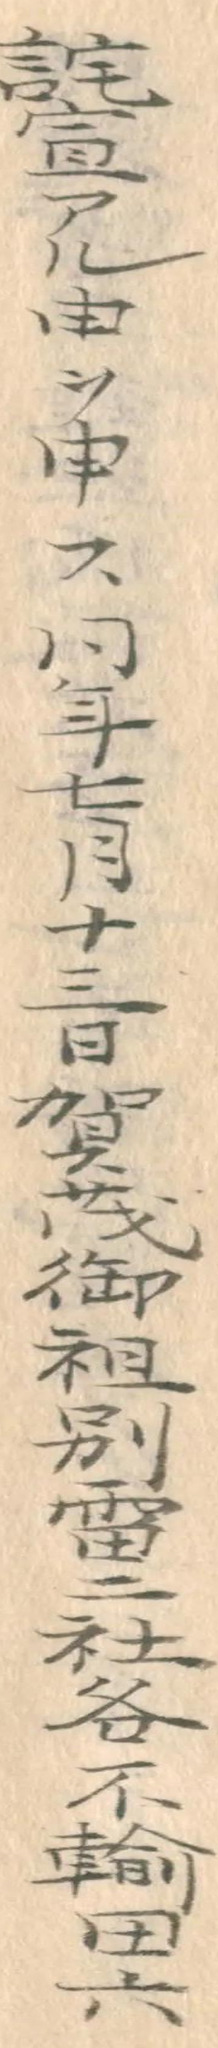詫宣アル由ヲ申ス同年七月十三日賀茂御祖別雷二社各不輸田六
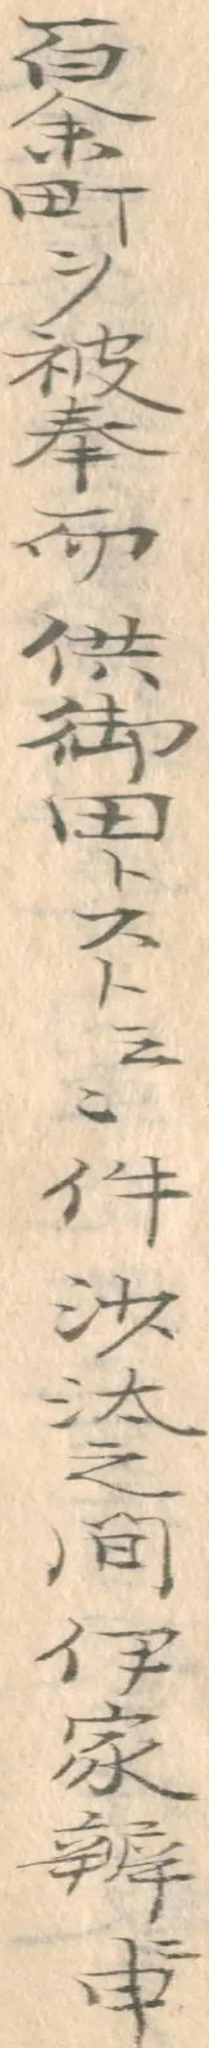百余町ヲ被奉而供御田トスト云々件沙汰之間伊家弁ニ申
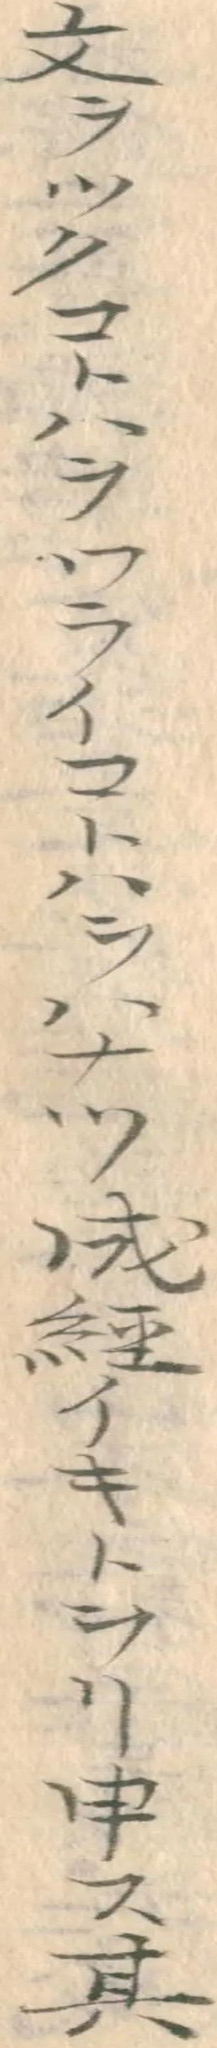文ヲツクコトハヲワライコトハヲハナツ成経イキトヲリ甲ス其
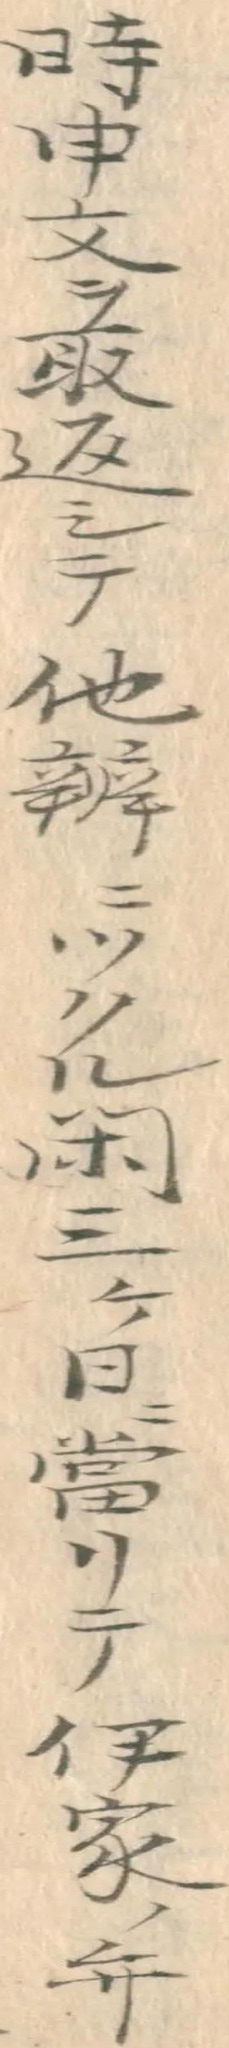時申文ヲ取返シテ他弁ニツクル閑三ケ日ニ当リテ伊家ノ弁
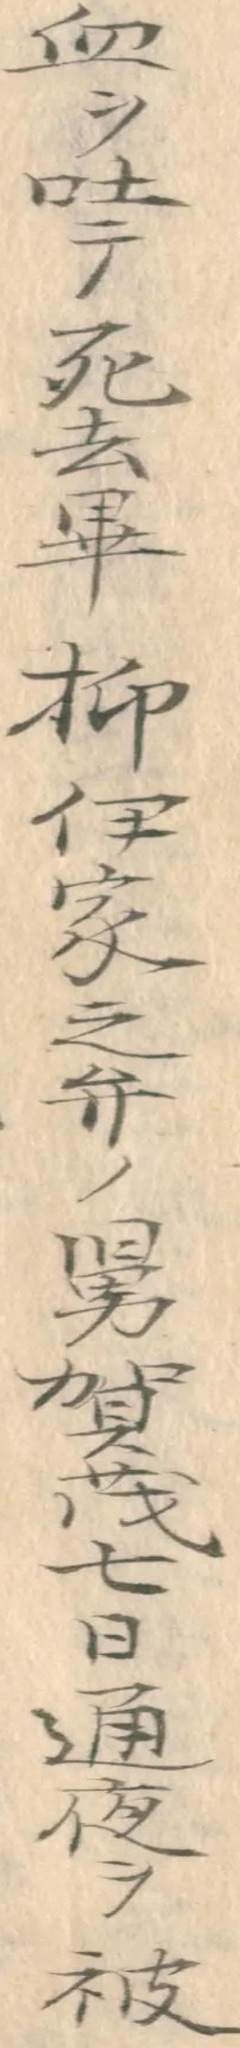血ヲ吐テ死去畢抑伊家之弁ノ舅賀茂七日通夜ヲ被
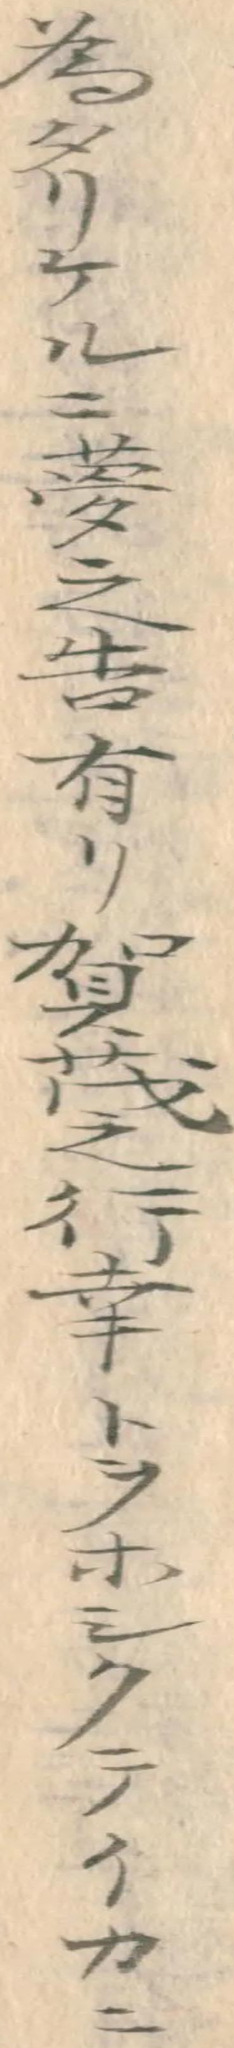為タリケルニ夢之告有リ賀茂之行幸トヲホシクテイカニ
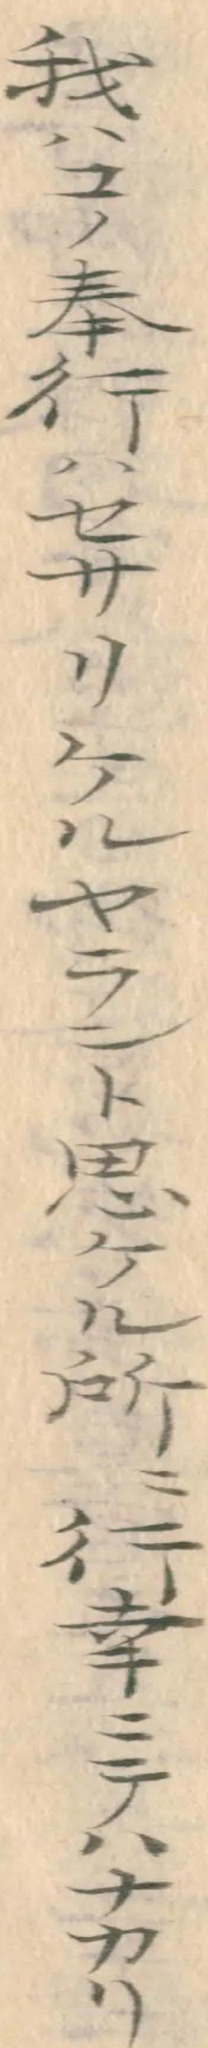我ハコノ奉行ハセサリケルヤラント思ケル所ニ行幸ニテハナカリ
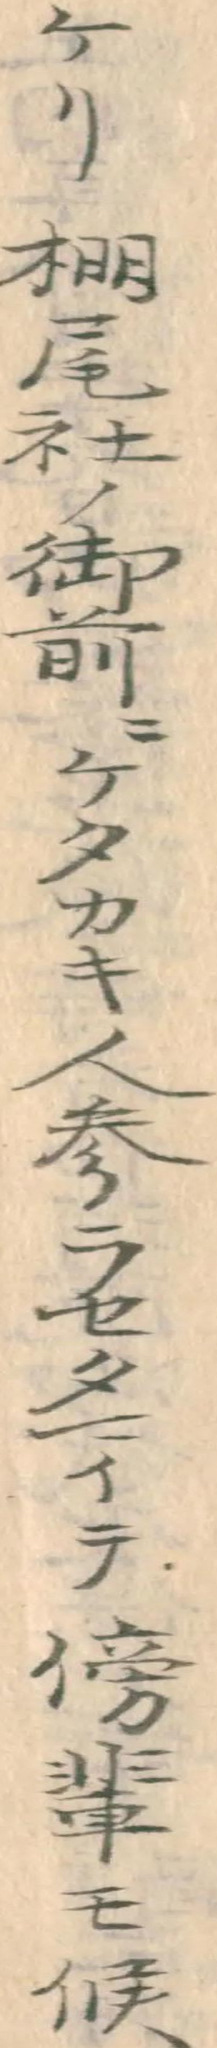ケリ棚尾社ノ御前ニケタカキ人参ラセタマイテ傍輩モ候
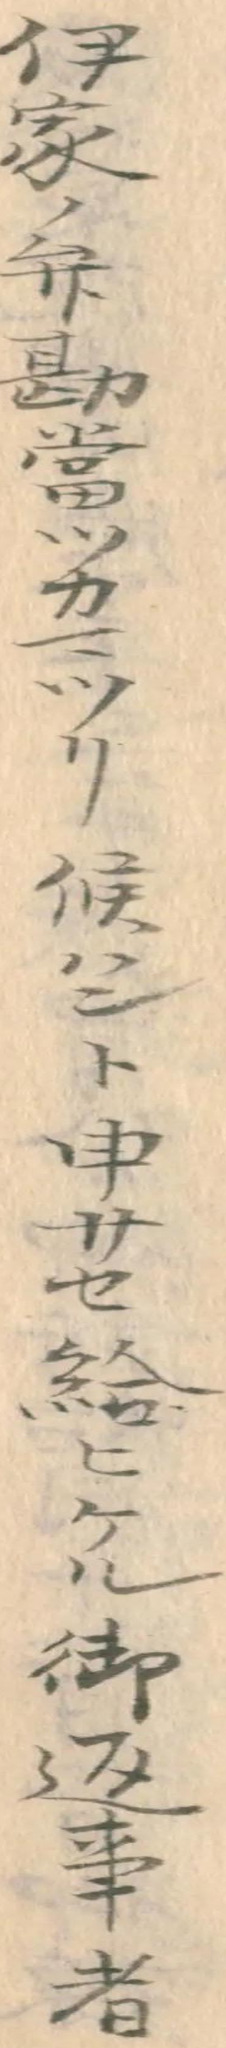伊家ノ弁勘当ツカマツリ候ハント申サセ給ヒケル御返事者
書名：賀茂社記録. 第24冊
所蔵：国立国会図書館 National Diet Library, JAPAN
